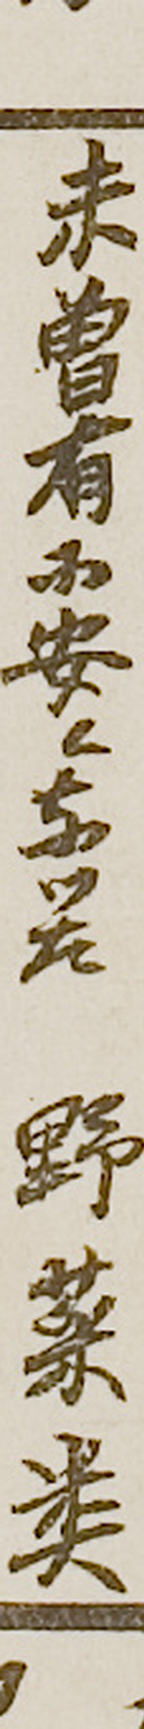未曽有に安くなツた野菜類
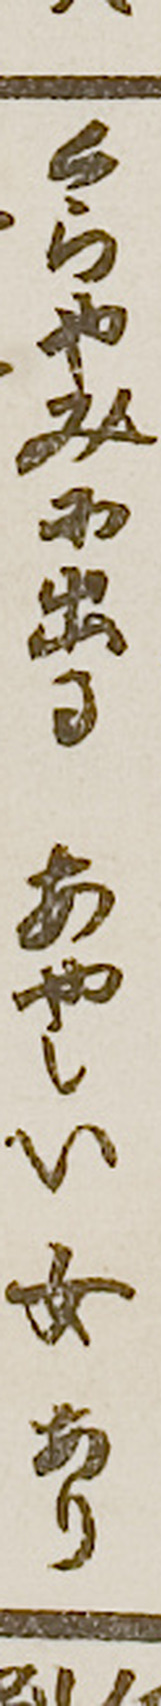くらやみに出るあやしい女あり
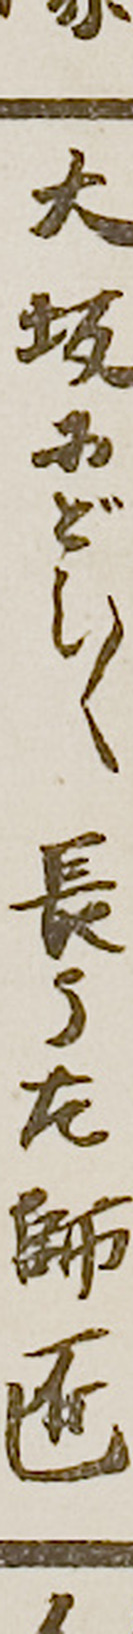大坂にどし〳〵長うた師匠
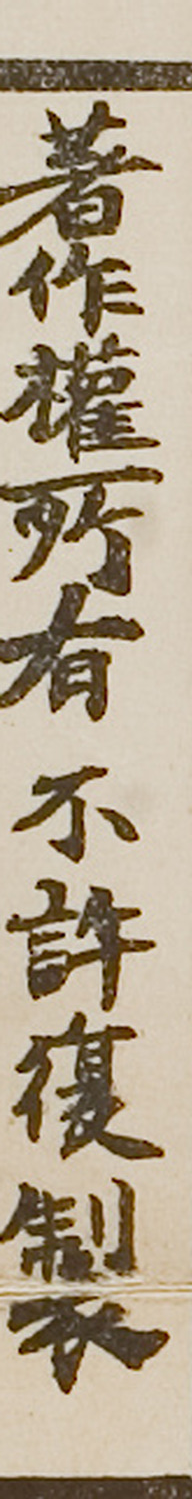著作権所有不許復製
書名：帝都大震災一覧
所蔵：東京大学総合図書館 General Library in the University of Tokyo, JAPAN
